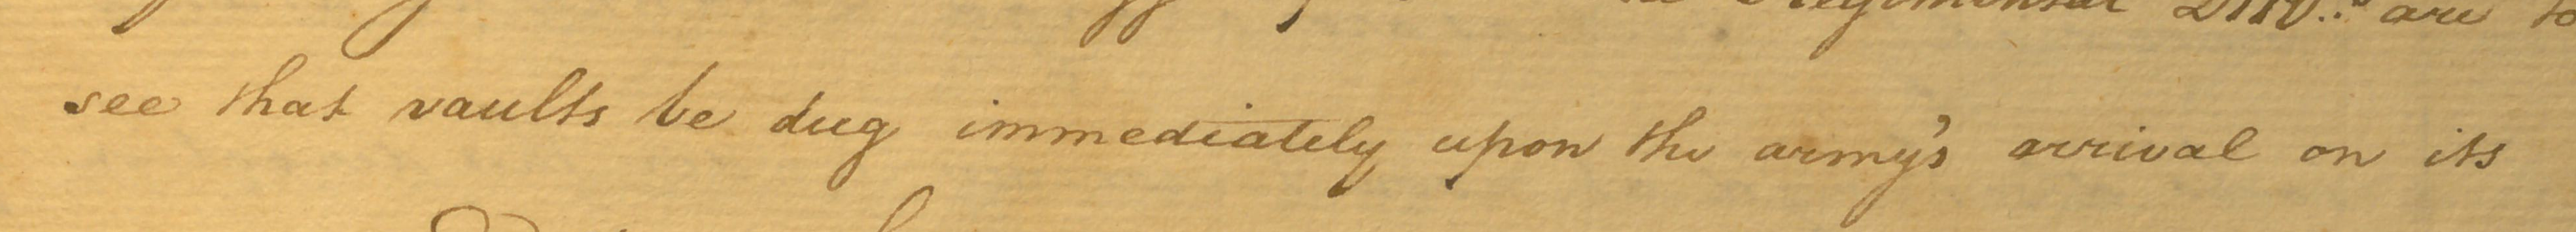see that vaults be dug immediately upon the army's arrival on its
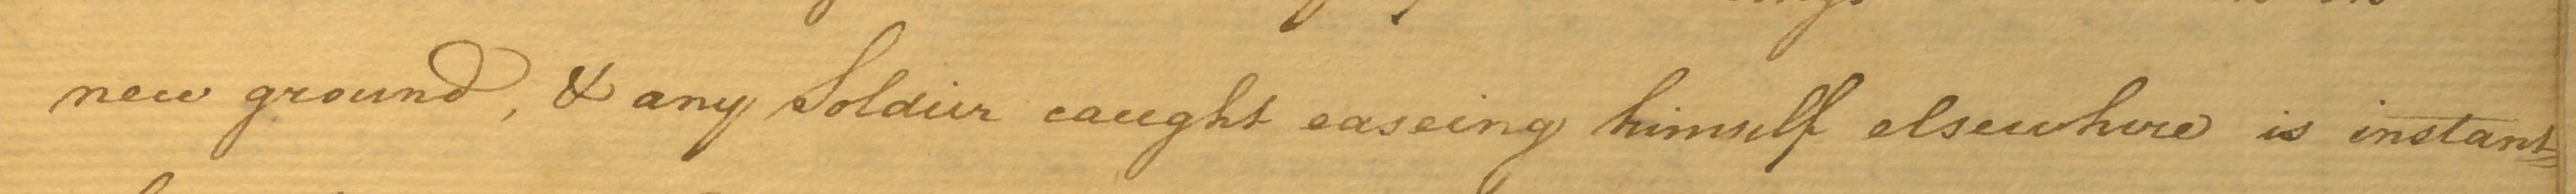new ground, & any Soldier caught easeing himself elsewhere is instant
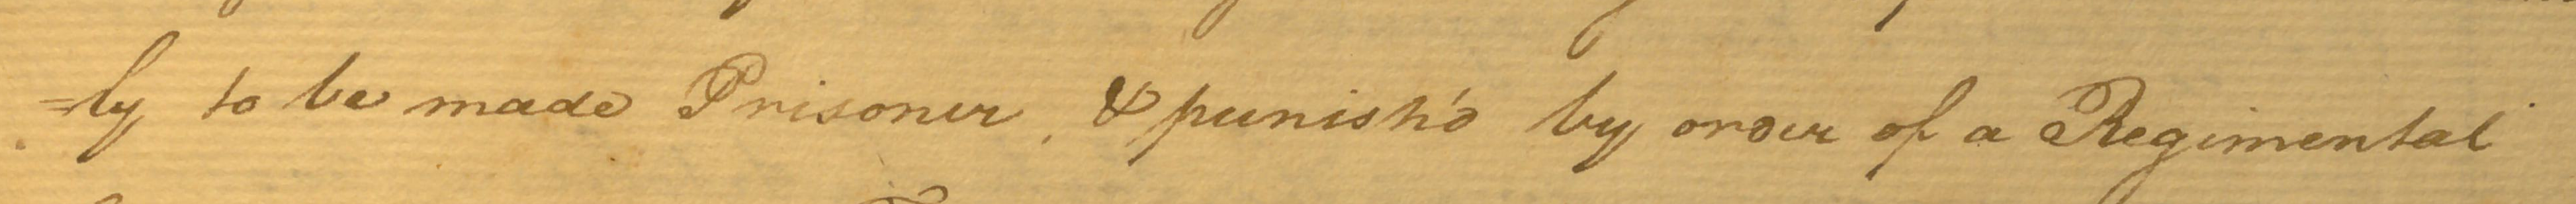-ly to be made Prisoner. & punish'd by order of a Regimental
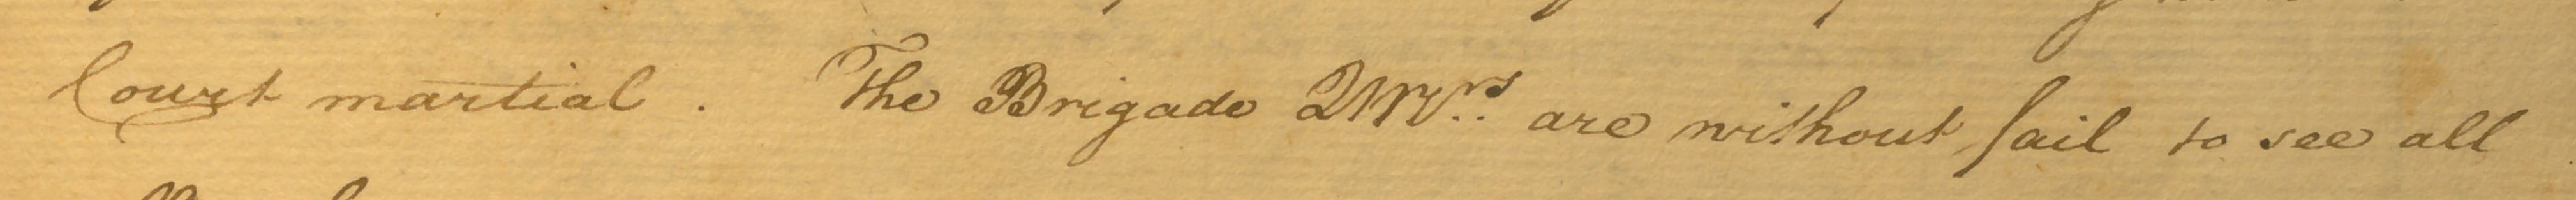Court martial. The Brigade QM^rs. are without fail to see all
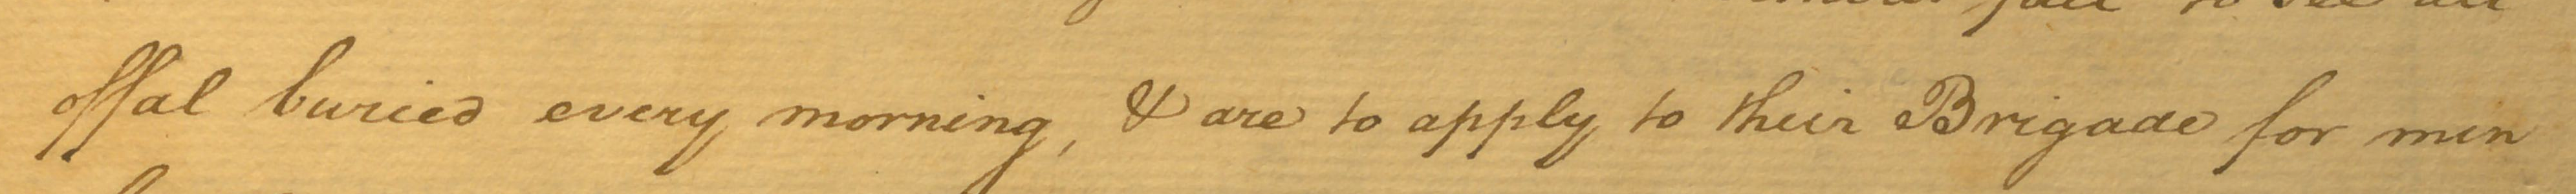offal buried every morning, & are to apply to their Brigade for men
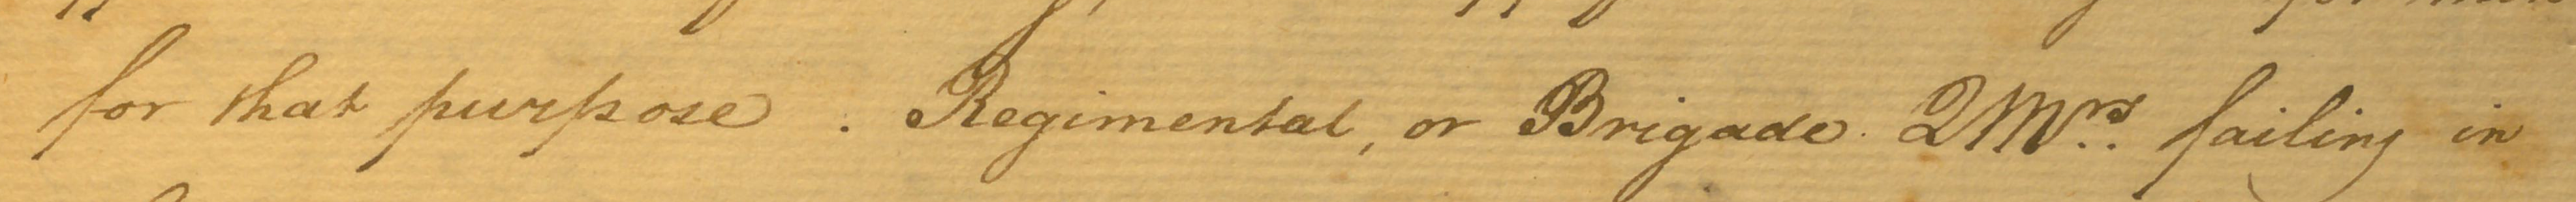for that purpose. Regimental, or Brigade QM^rs. failing in
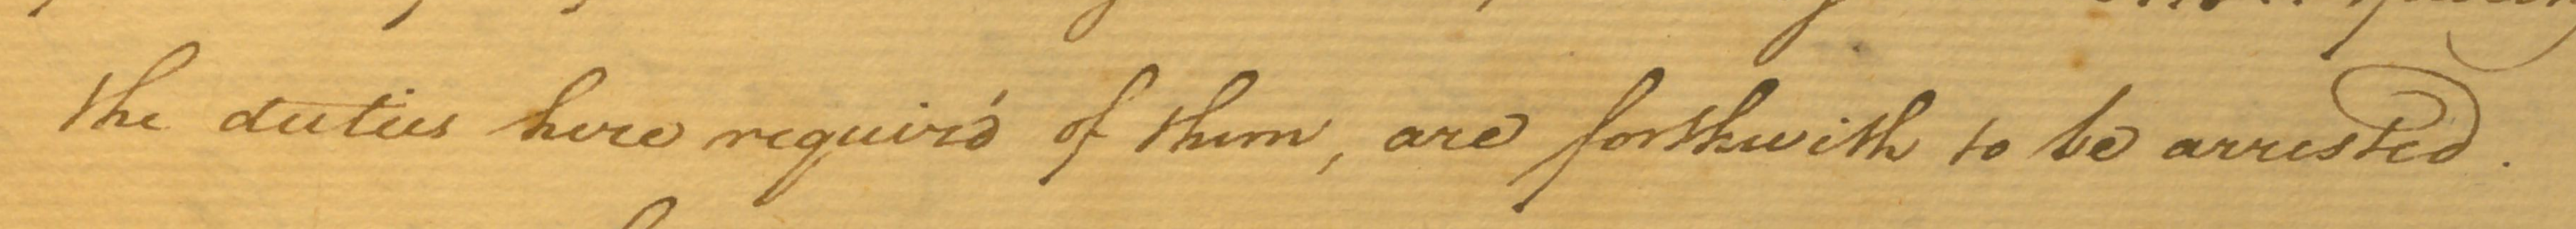the duties here requir'd of them, are forthwith to be arrested.
